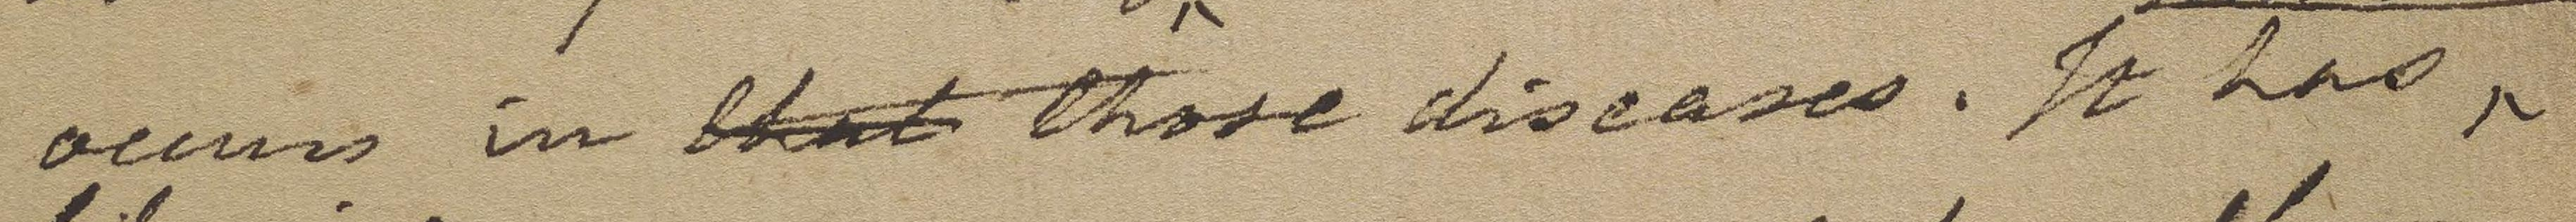occurs in [that] diseases. It has ^
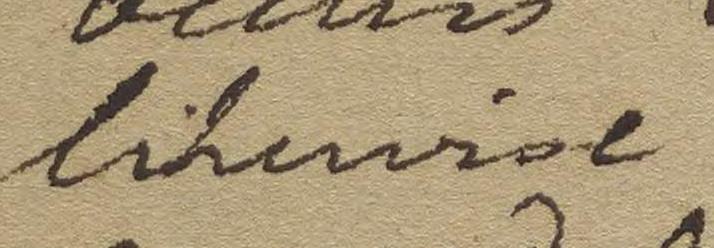likewise
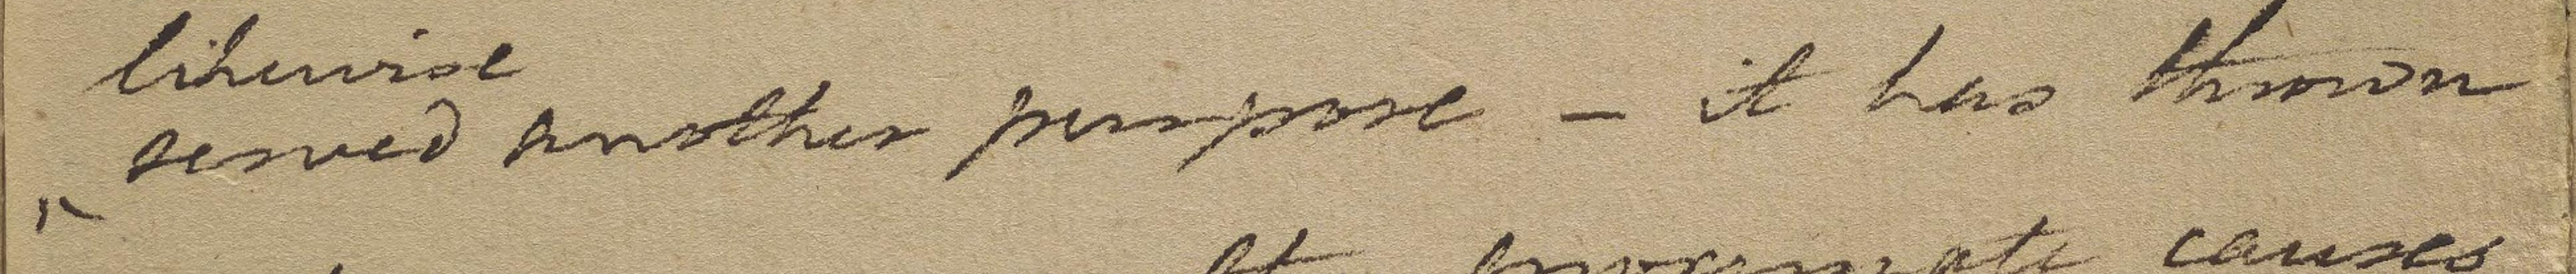^served another purpose, it has thrown
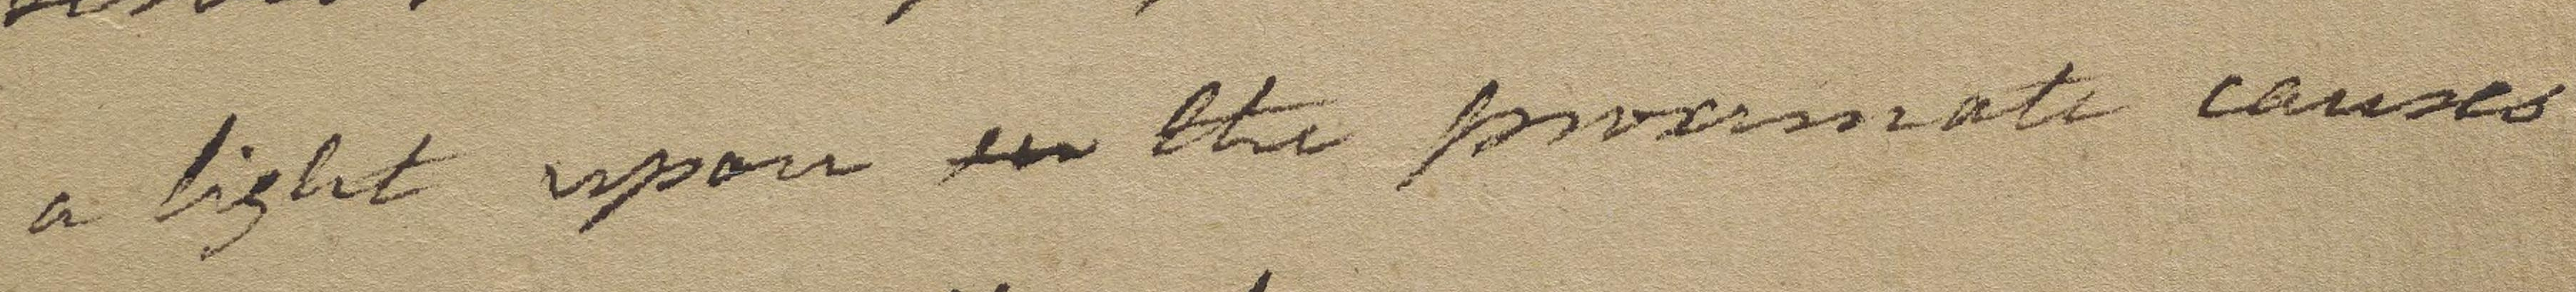a light upon the proximate causes
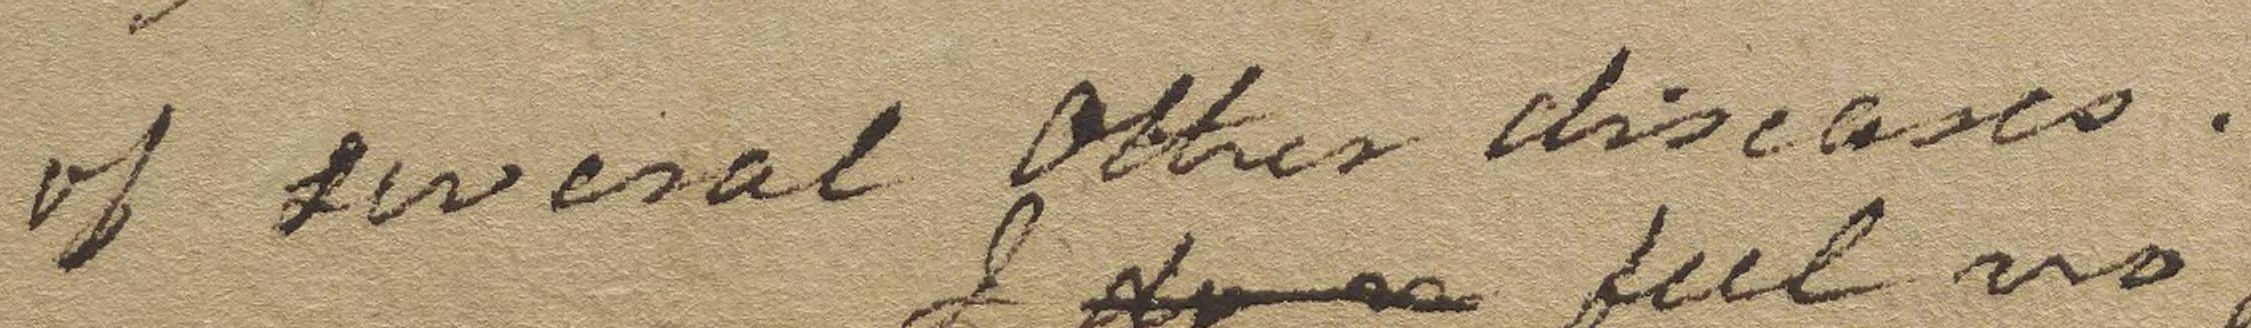of several other diseases.
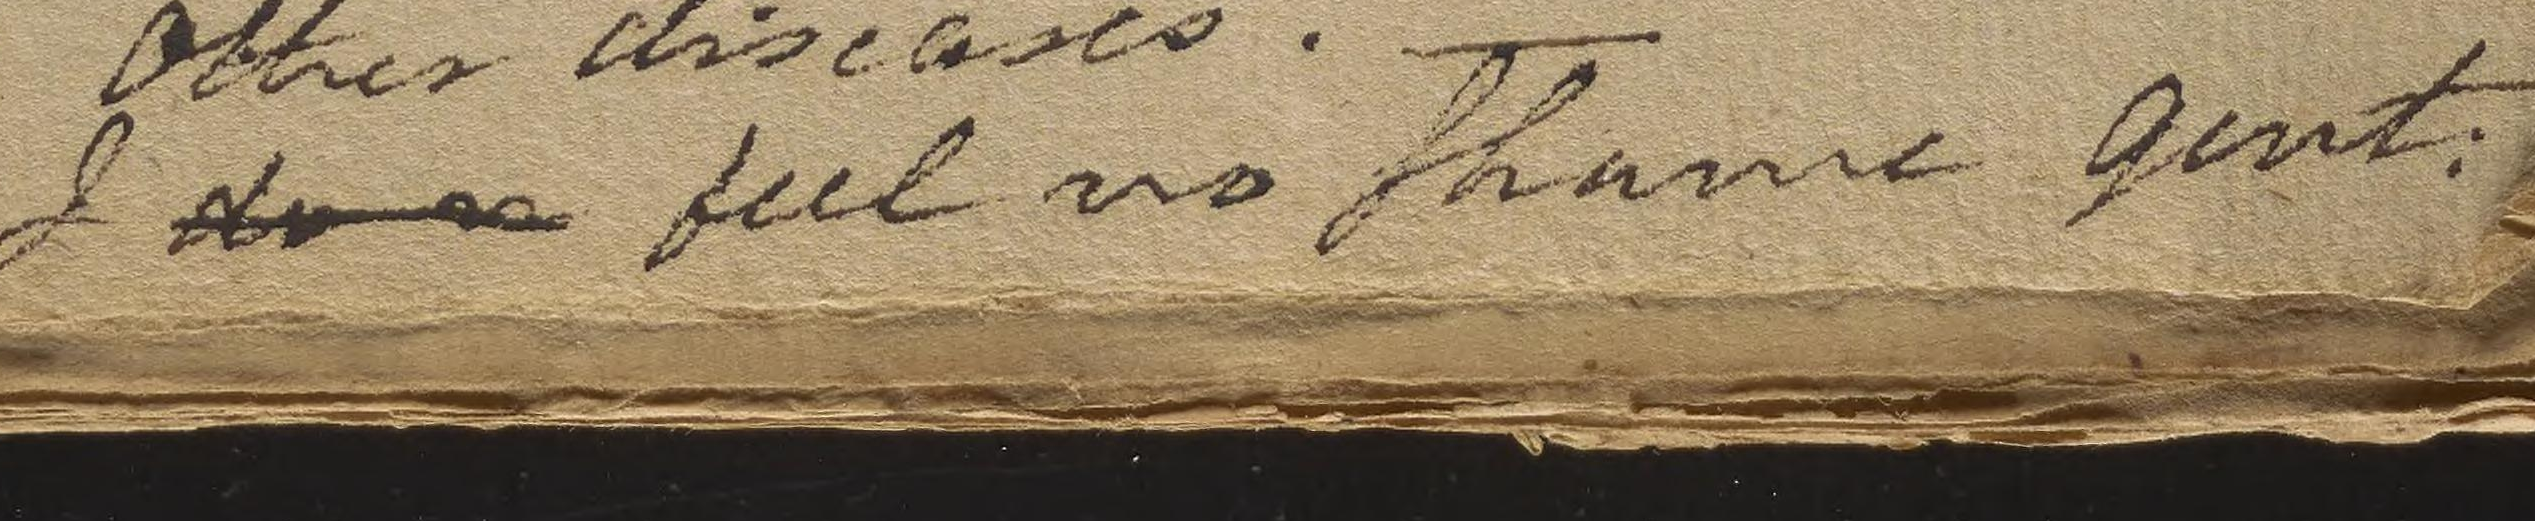I [do n] feel I have gent:
